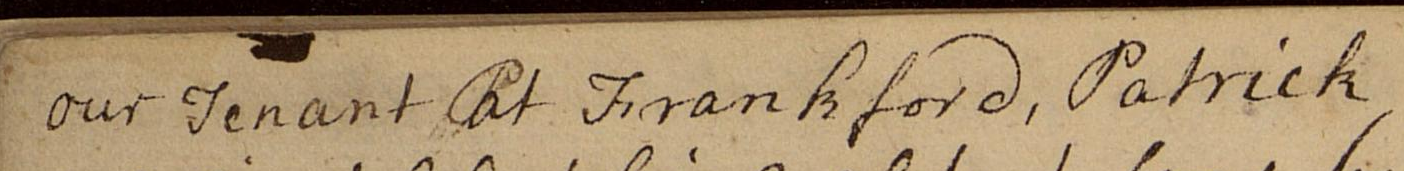our Tenant at Frankford, Patrick
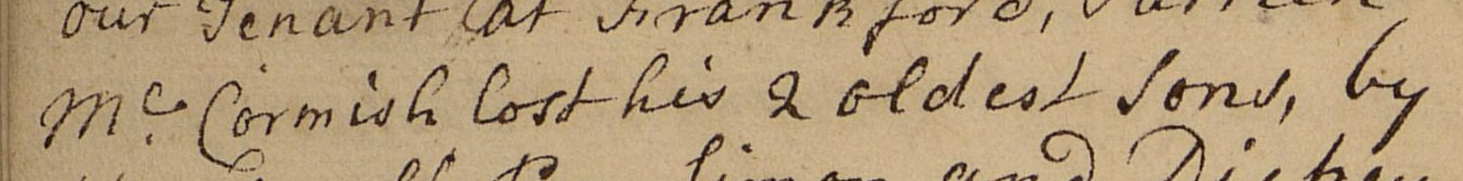M^c Cormish lost his 2 oldest Sons, by
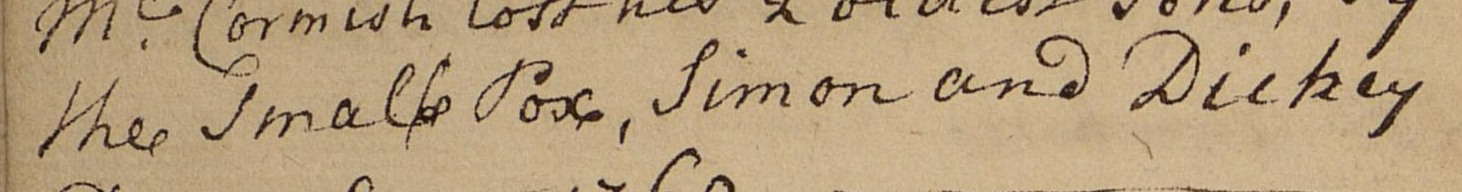the Small Pox, Simon and Dickey
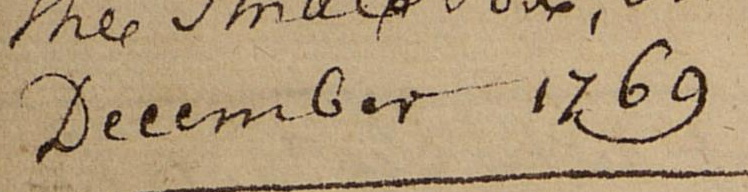December 1769
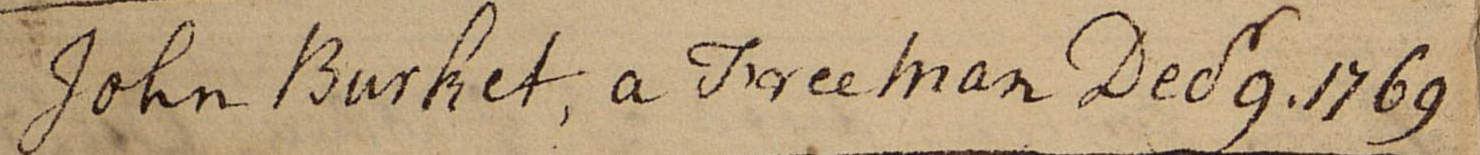John Burket, a Free Man Dec^r 9. 1769
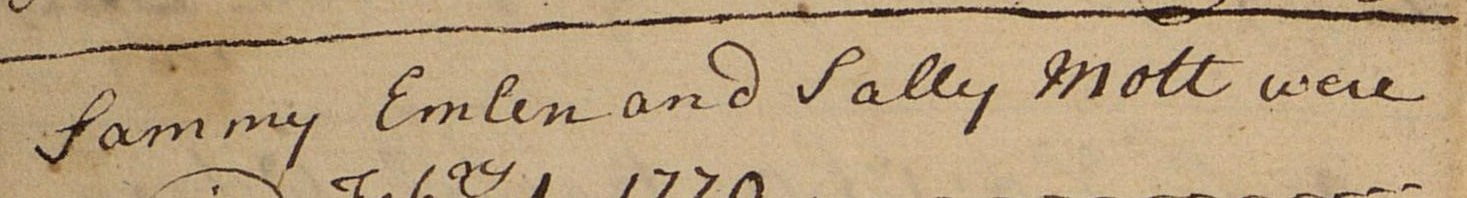Sammy Emlen and Sally Mott were
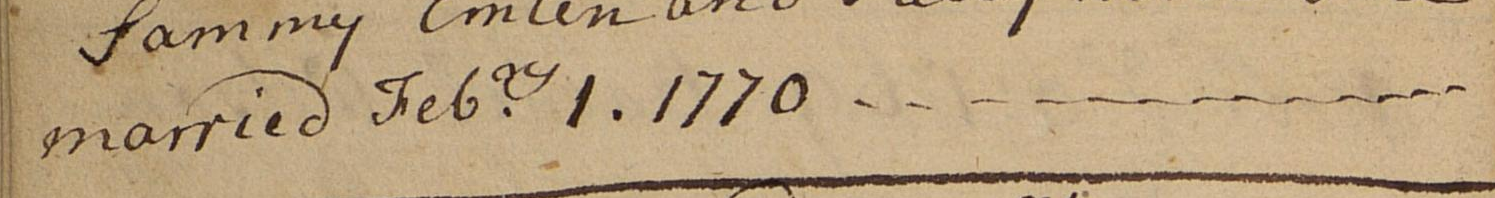married Feb^ry 1. 1770 -
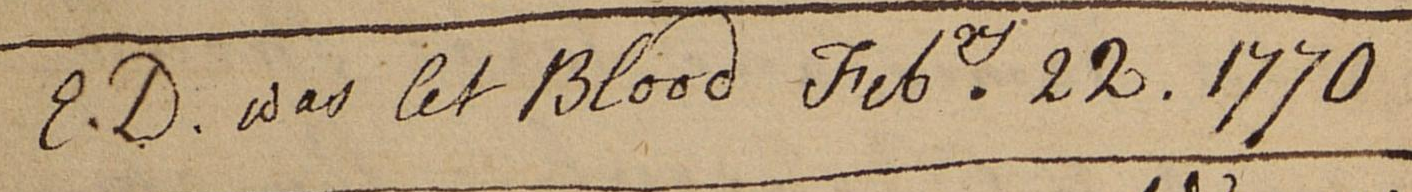E.D. was let Blood Feb^ry 22. 1770
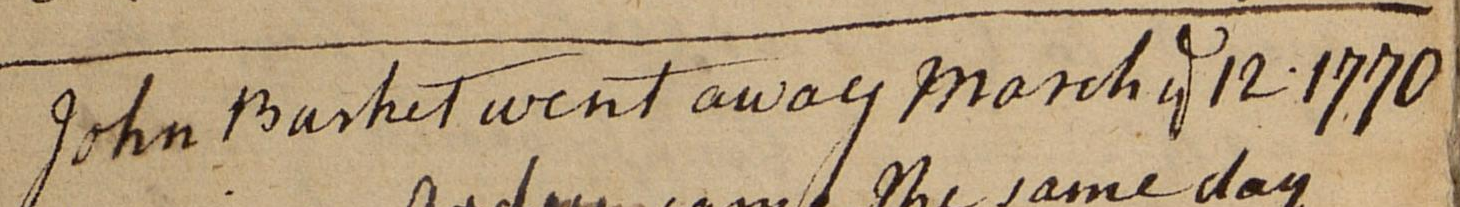John Burket went away March y^e 12 1770
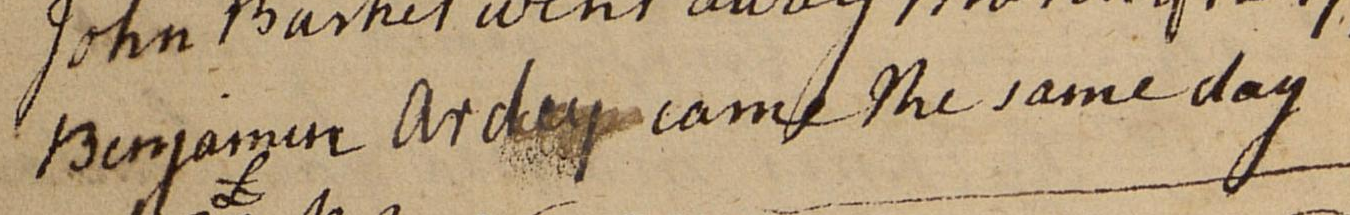Benjamin Ardey came the same day
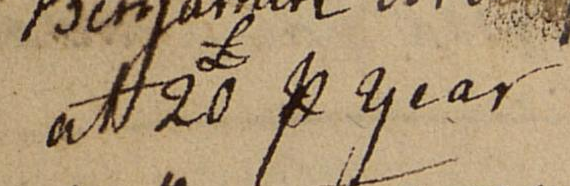at 20 sterlings per year
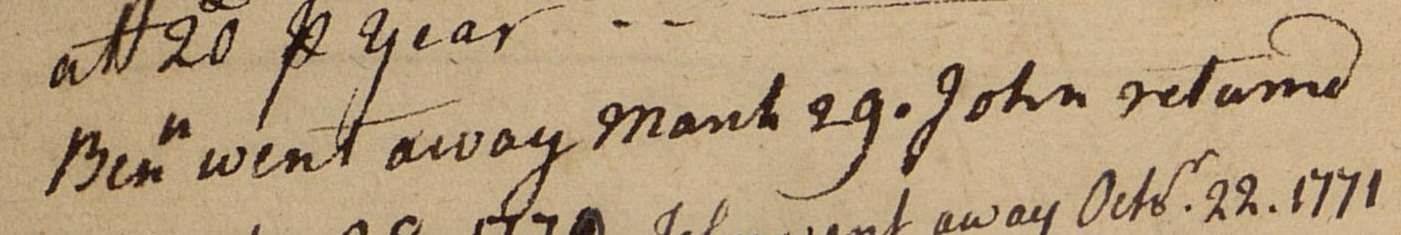Ben^n went away March 29. John returnd
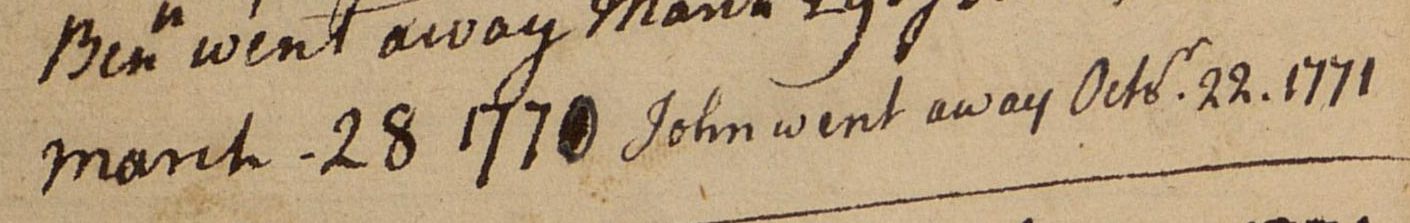March - 28 1770 John went away Oct^r 22. 1771
